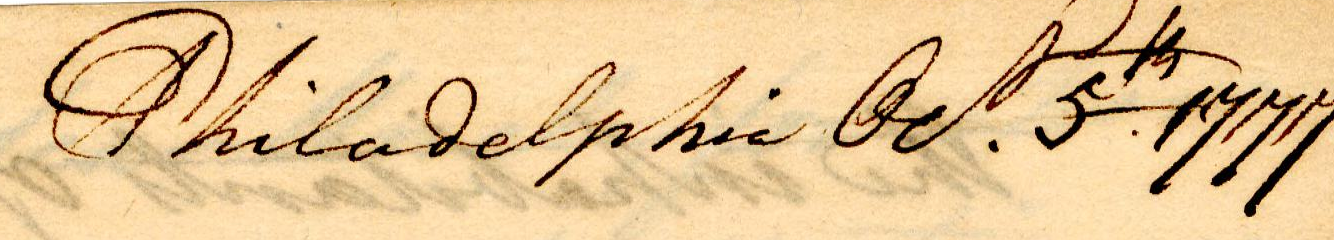Philadelphia Oc^t. 5^th 1777
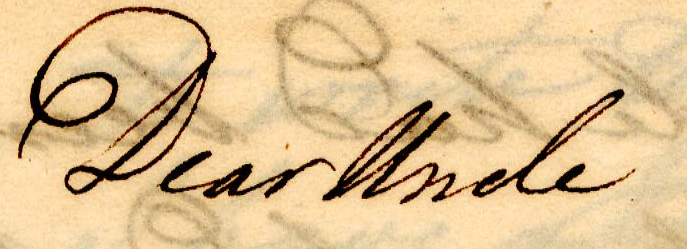Dear Uncle
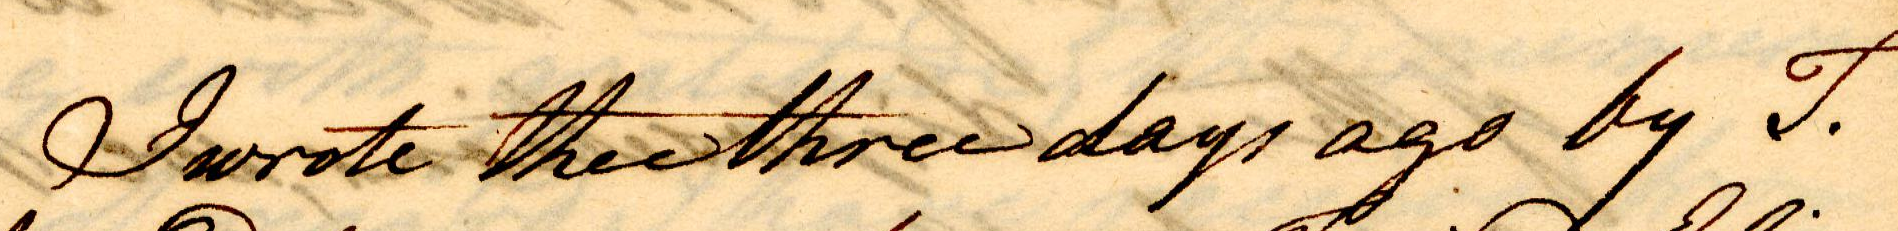I wrote thee three days ago by T.
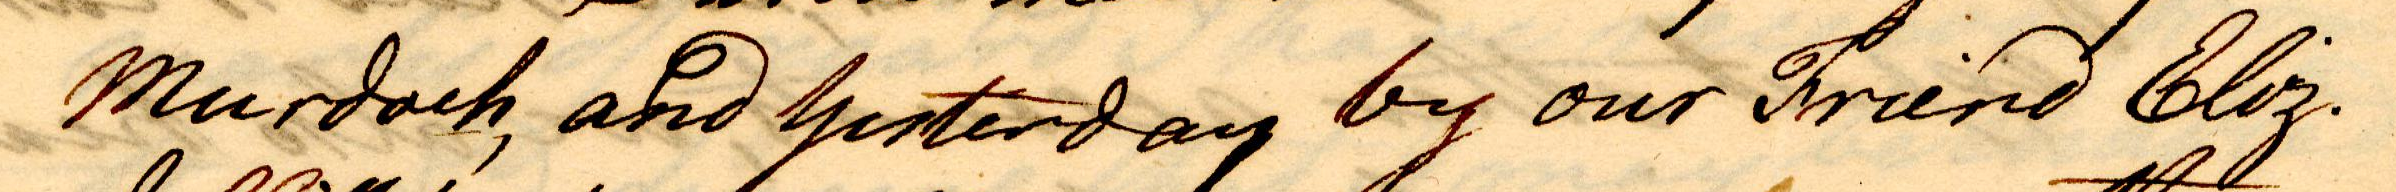Murdoch, and yesterday our Friend Eliz.
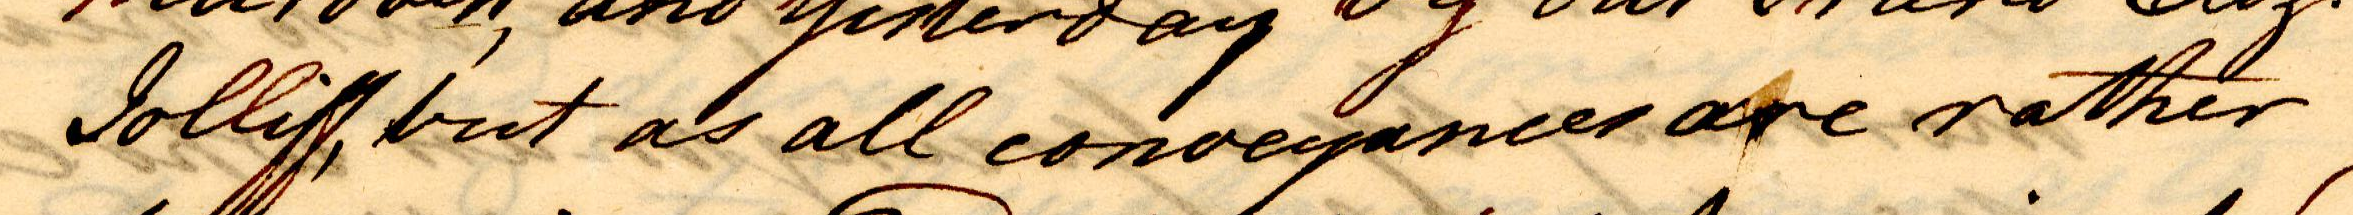Jolliff, but as all consequences are rather
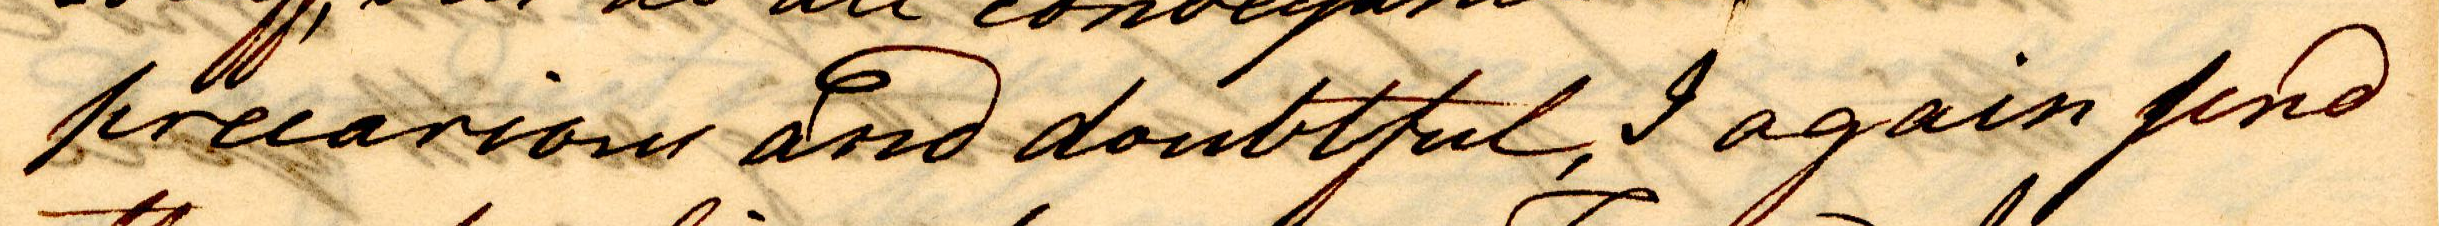precarious and doubtful, I again send
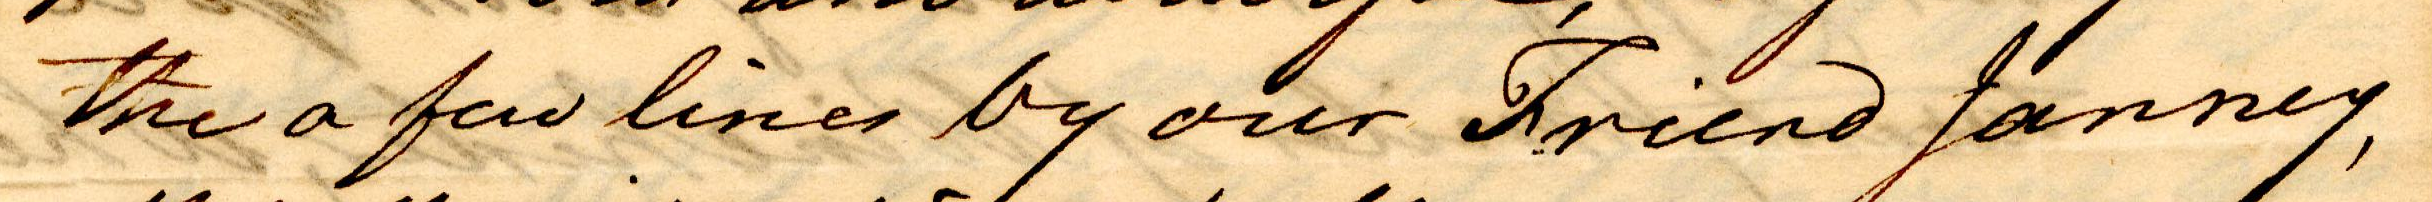the a few lines by our Friend Janney
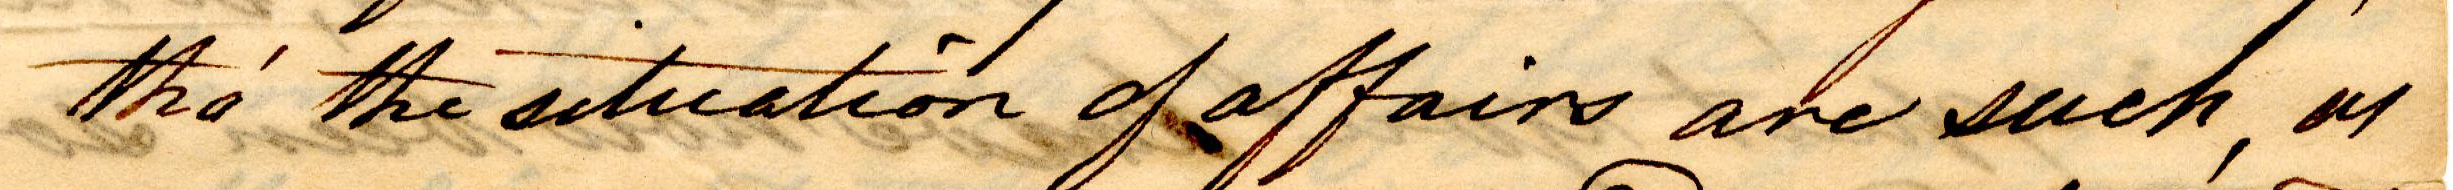tho' the situation of affairs are such, as
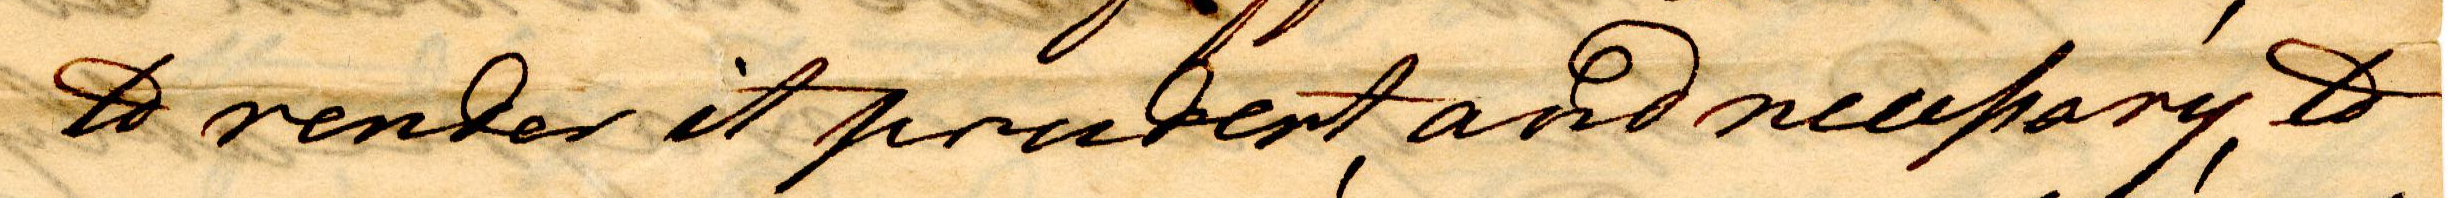to render it prudent, and necessary, to
